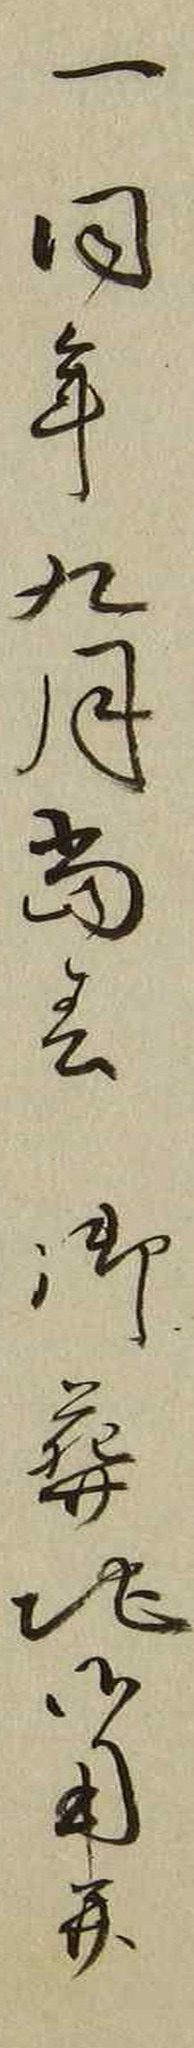一同年九月当春御葬地御用幷
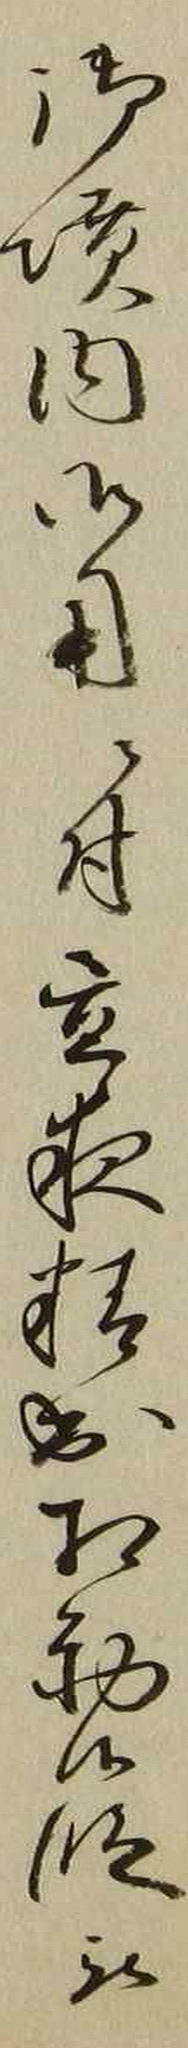御墳内御用に付昼夜精出相勤候段被
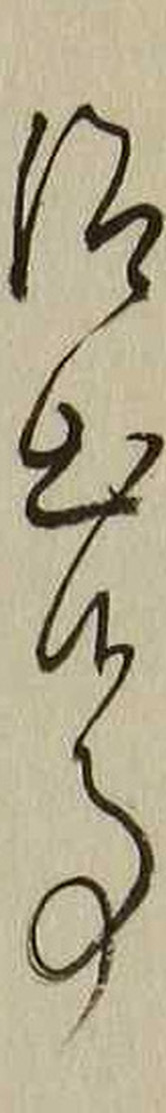仰出候事
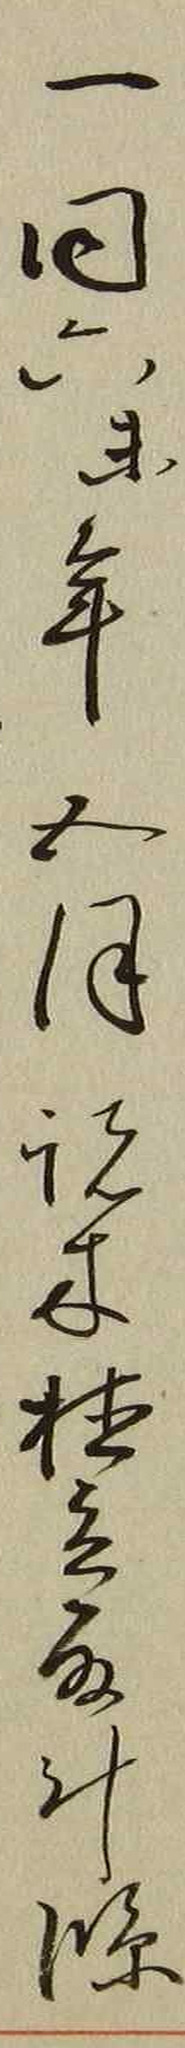一同六未年五月諸木植立取計臨
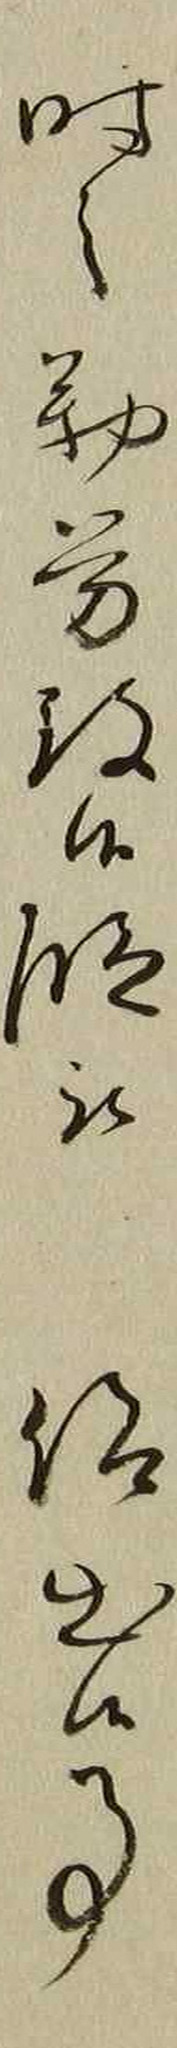時之勤労致候段被仰出候事
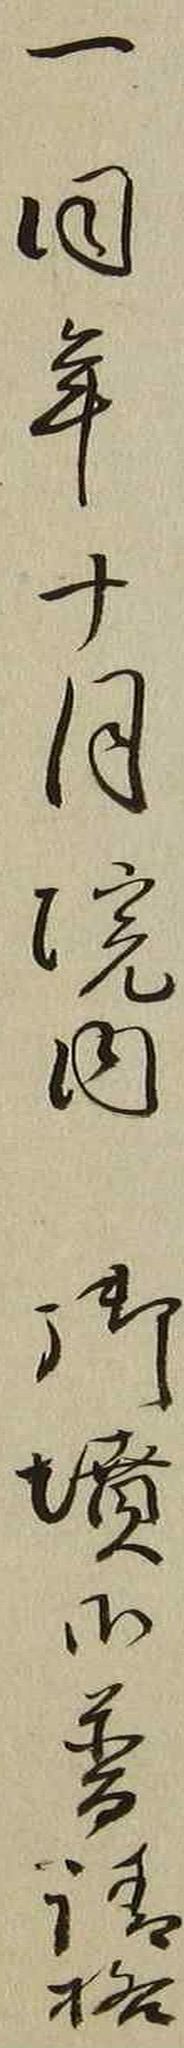一同年十月院内御墳御普請格
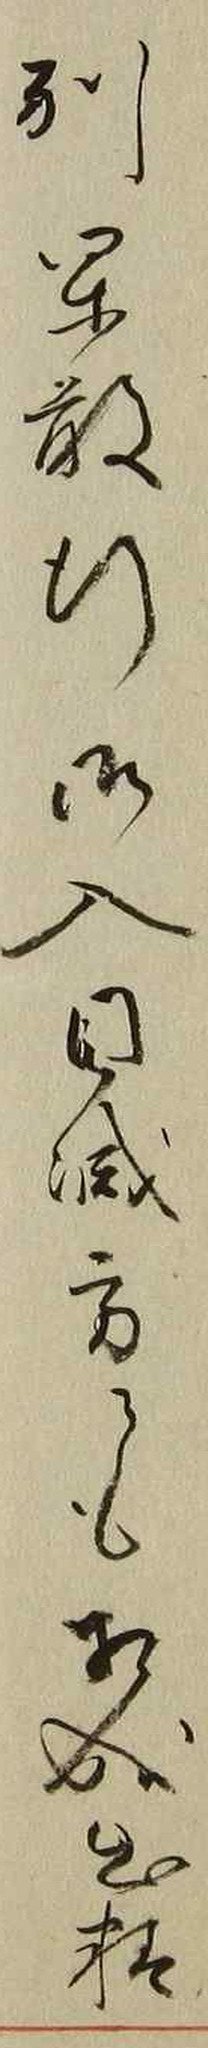別果敢行御入目減方にも相成出精
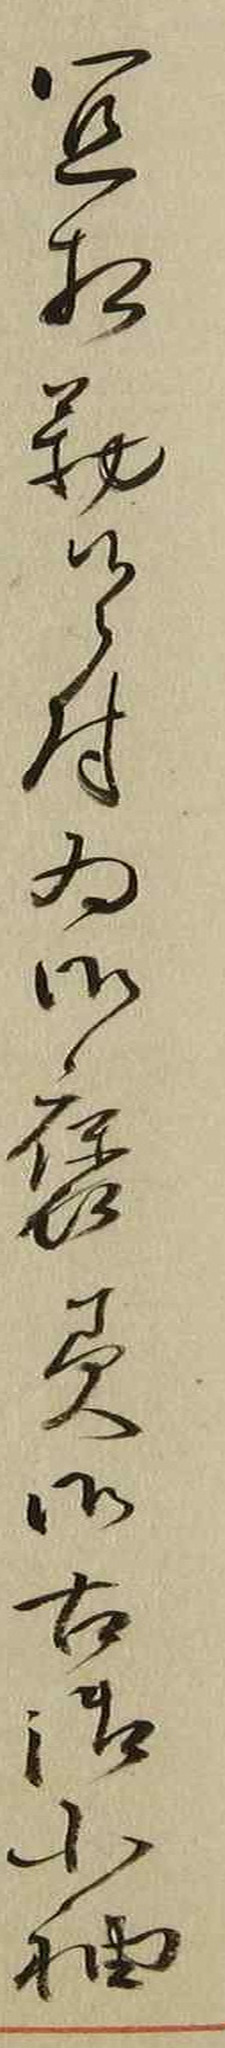宜相勤候に付為御褒美御古御小袖
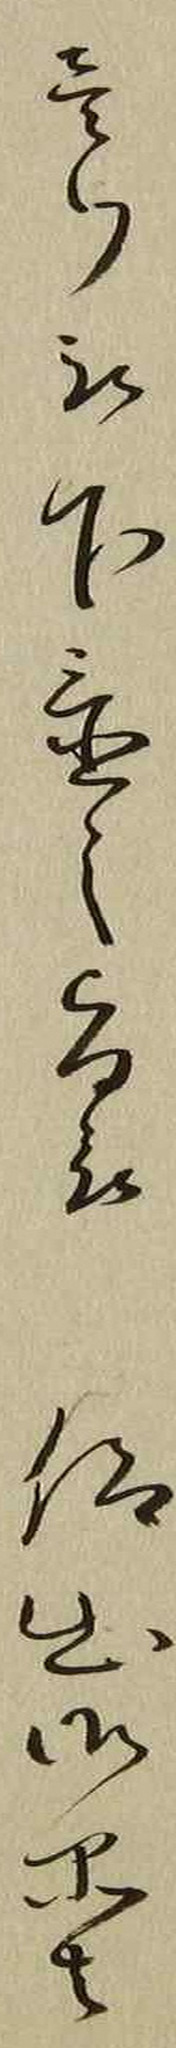壱ツ被下置之旨被仰出御品者
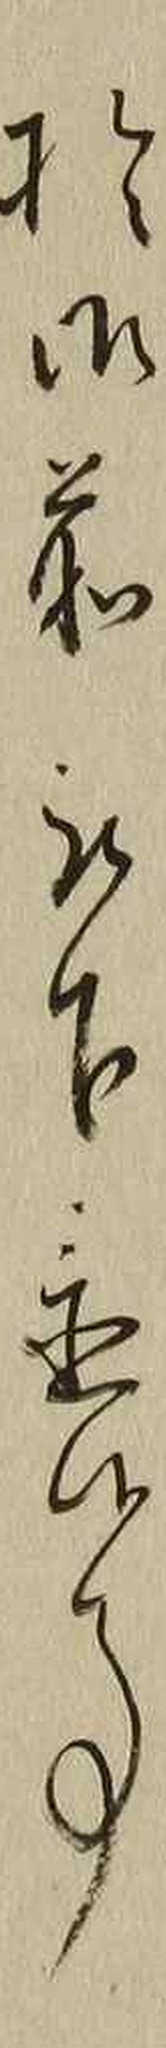於御前被下置候事
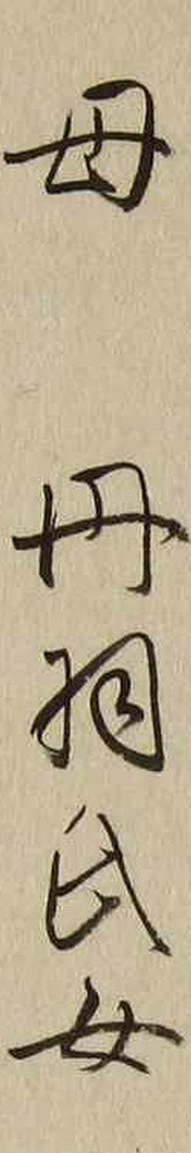母丹羽氏女
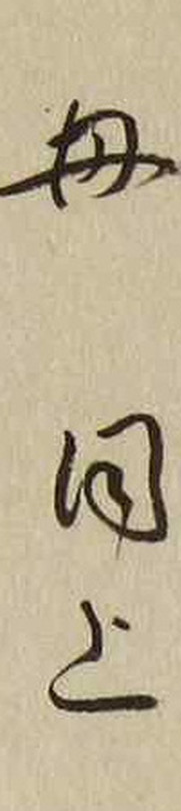母同上
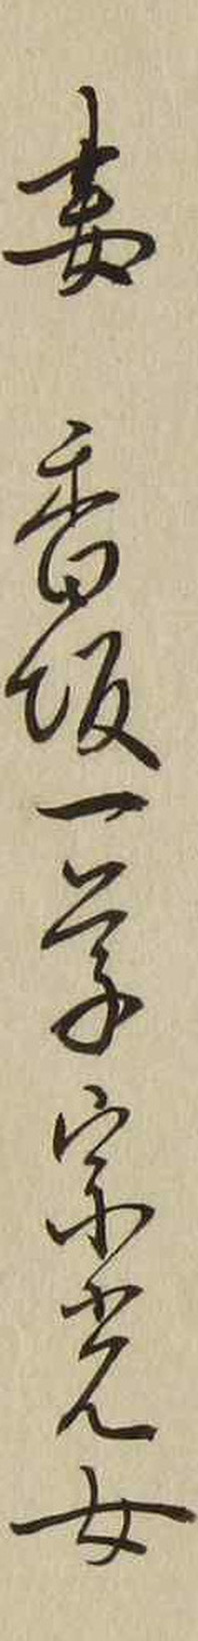妻香坂一学宗光女

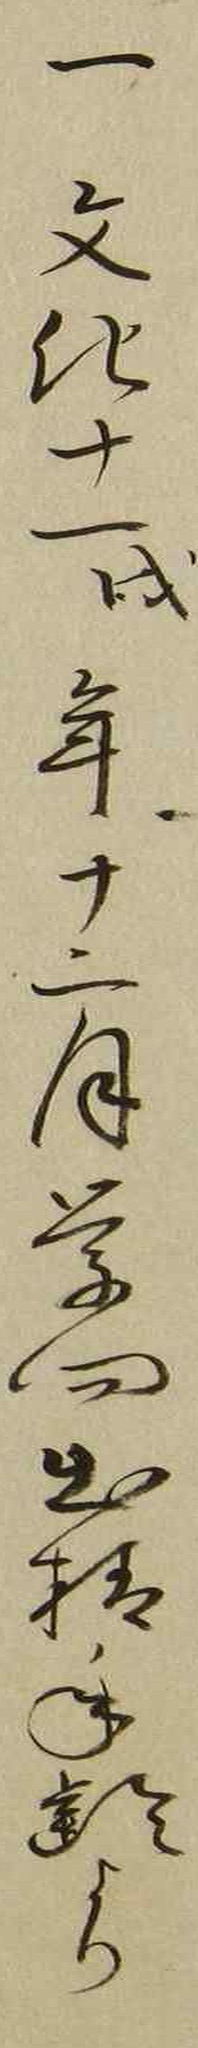一文化十一戌年十二月学問出精年齢よより
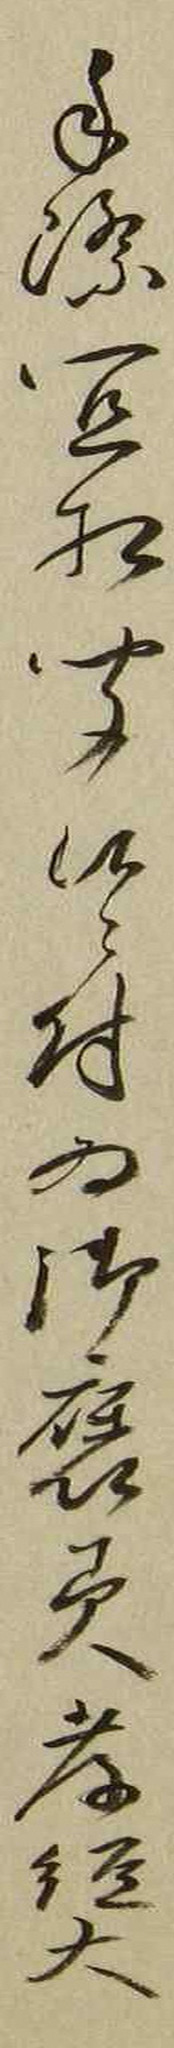手際宜相聞候に付為御褒美孝経大
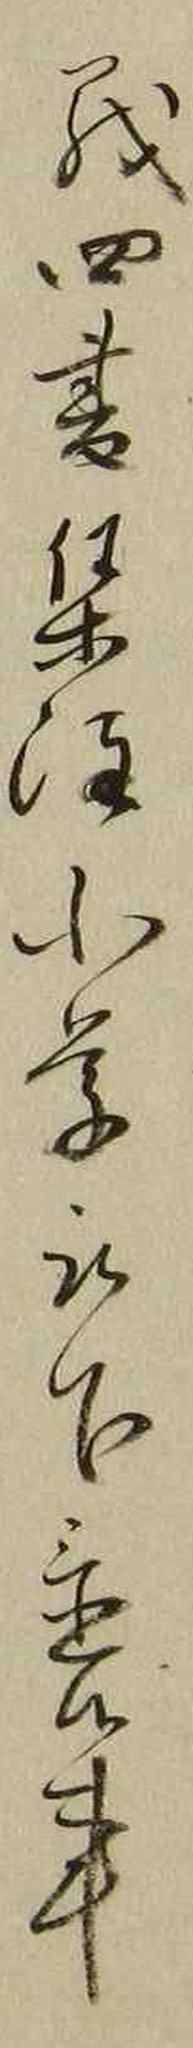義四書集注小学被下置候事
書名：諸士系譜　巻之3　い之部3
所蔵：会津若松市立会津図書館
